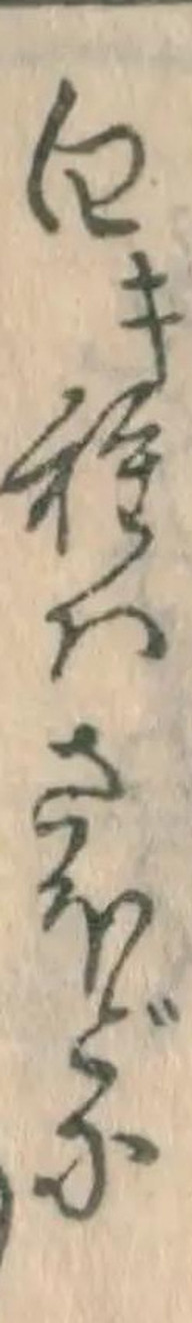白き種はさほどに
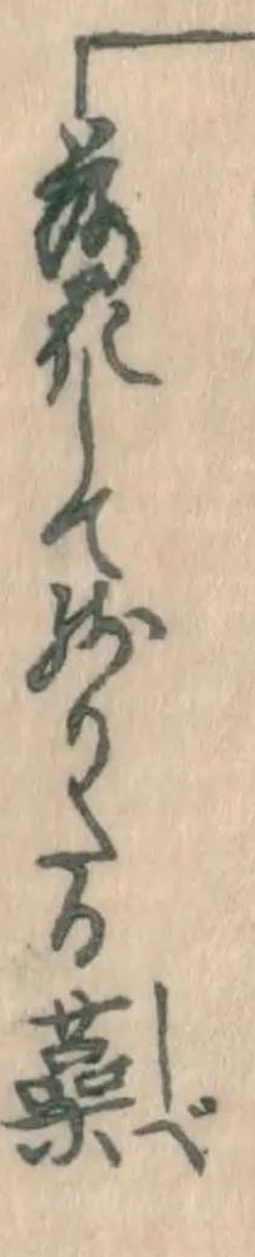落花して残りたる蘂
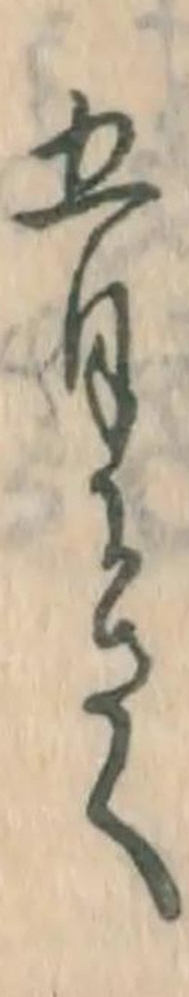五月にさく

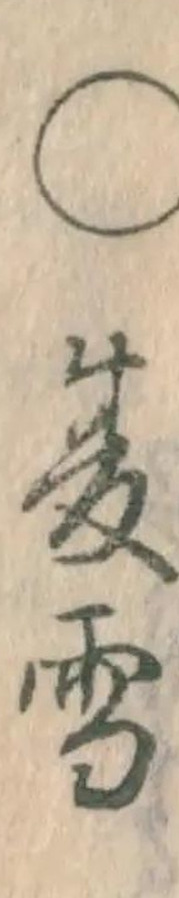〇夏雪
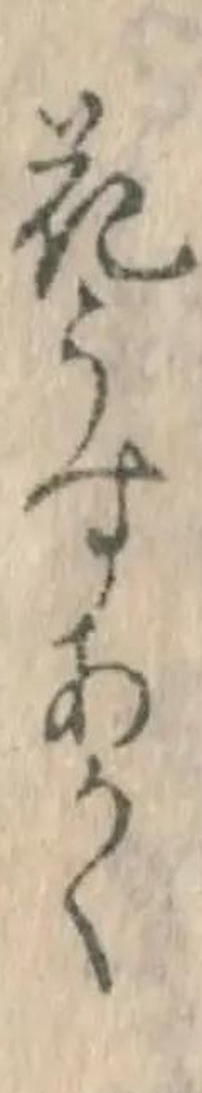花うすあかく
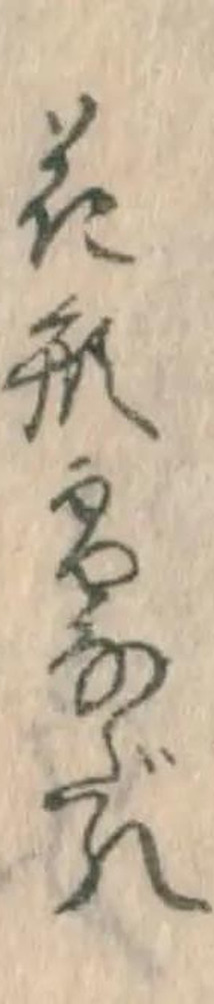花形雪なだれ
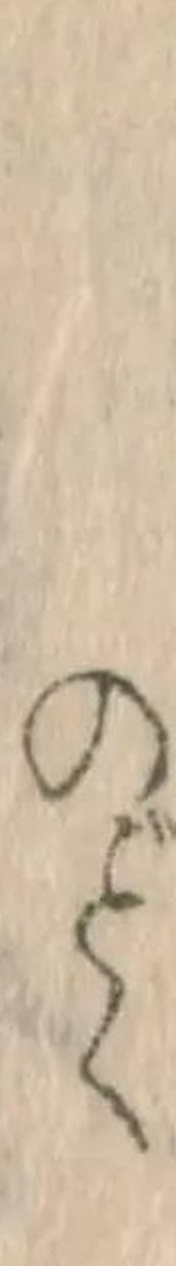のごとく
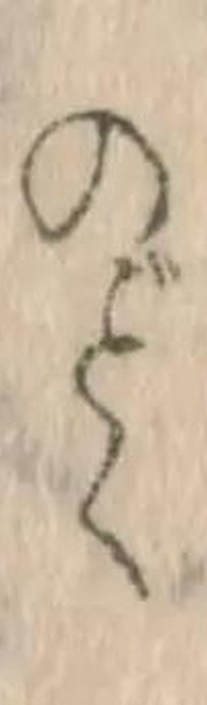のごとく
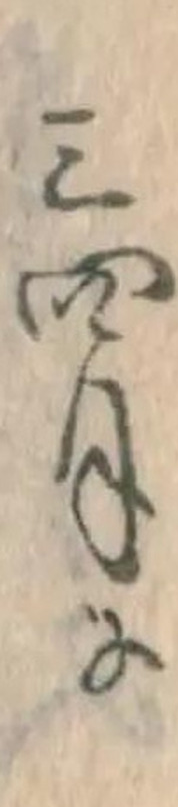三四月に
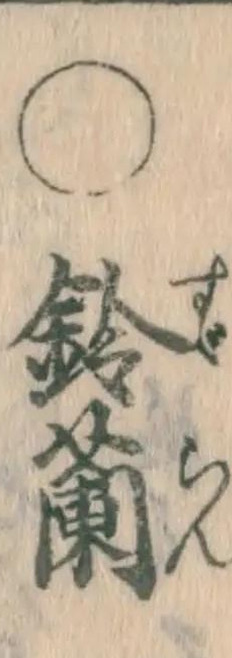〇鈴蘭
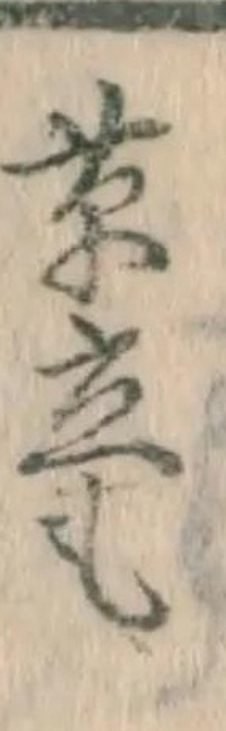草立も
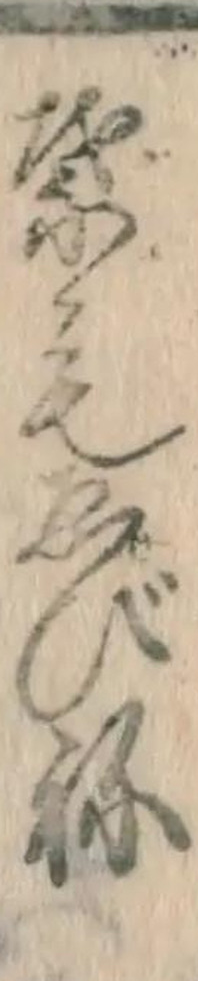葉もゑびね
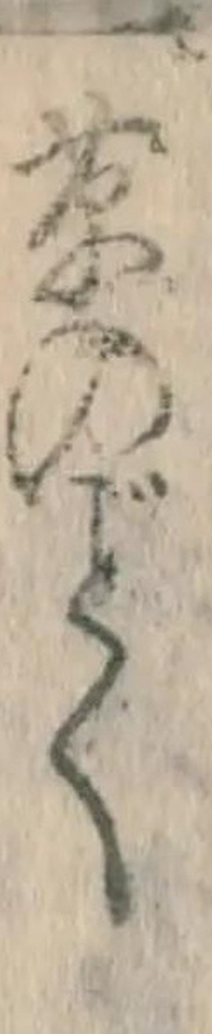草のごとく
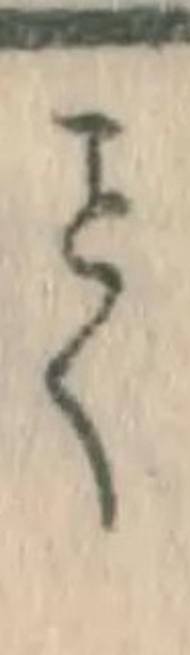ことく
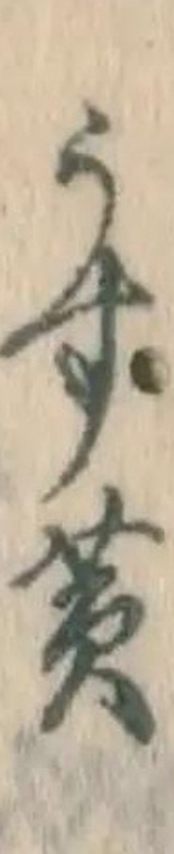うす黄
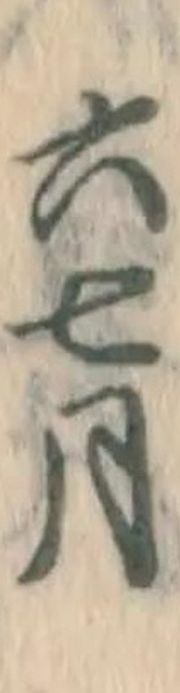六七月
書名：艸花繪前集. [3]
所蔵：国立国会図書館 National Diet Library, JAPAN
